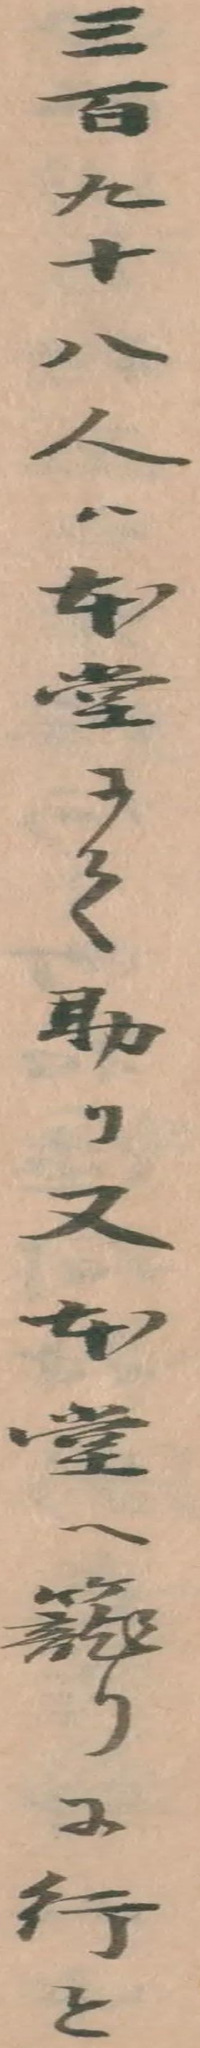三百九十八人ハ本堂にて助り又本堂へ篭りに行と
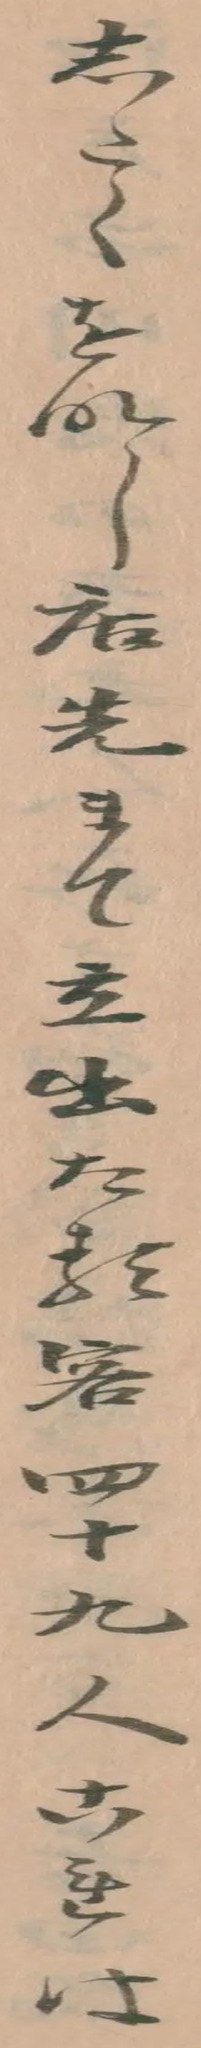したくをなし店先まて立出たる処四十九人これハ
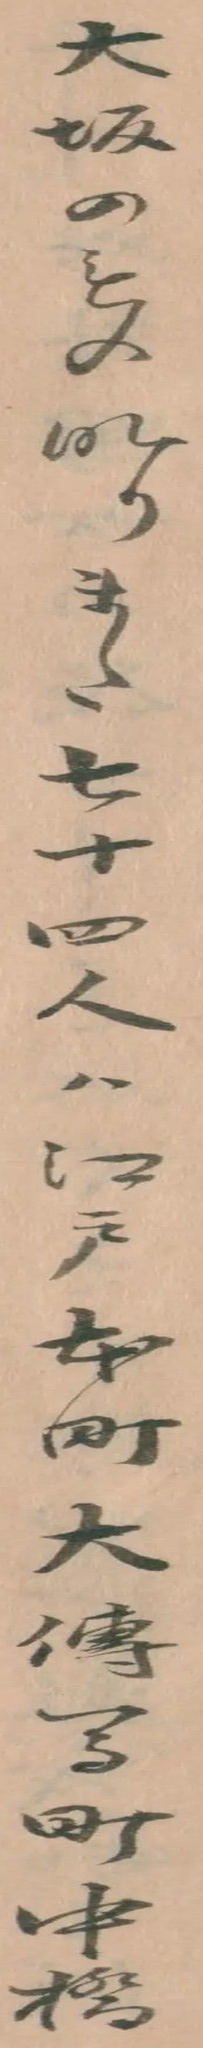大坂のものなりまた七十四人ハ江戸本町大伝馬町中橋
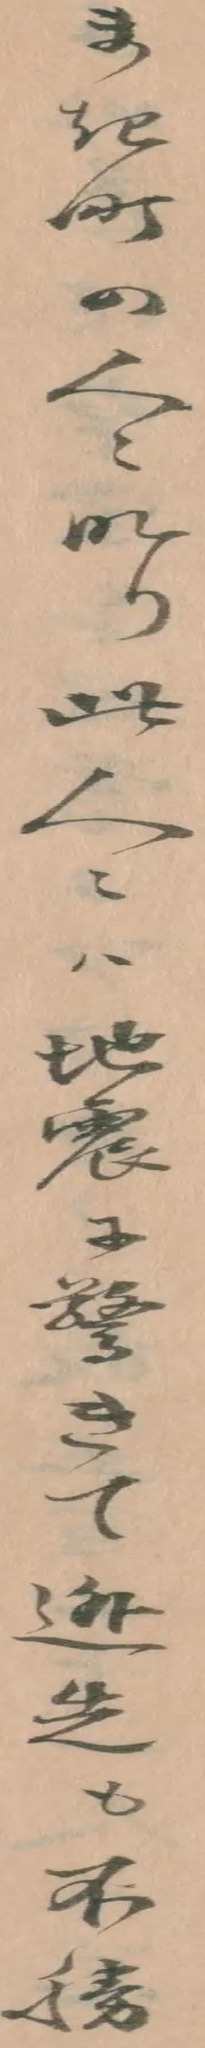まき丁の人々なり此人々ハ地震に驚きて逃先も不勝

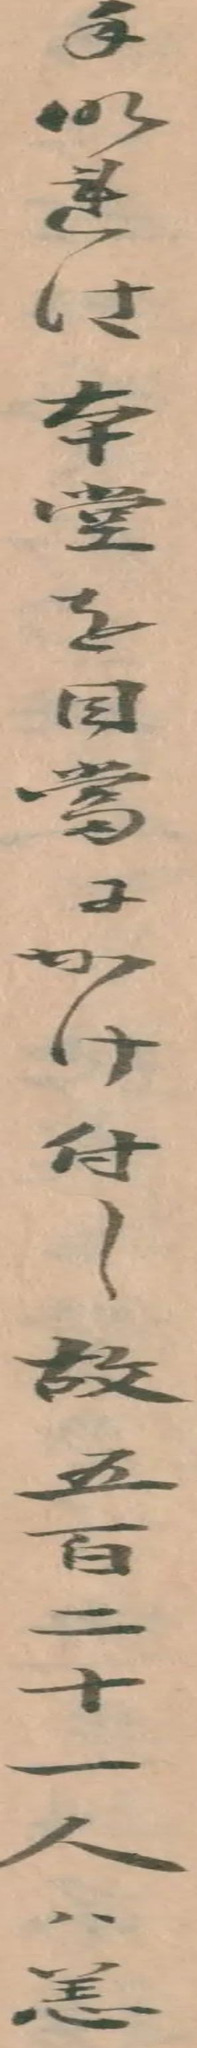手なれは本堂を目当にかけ付し故五百二十一人ハ恙
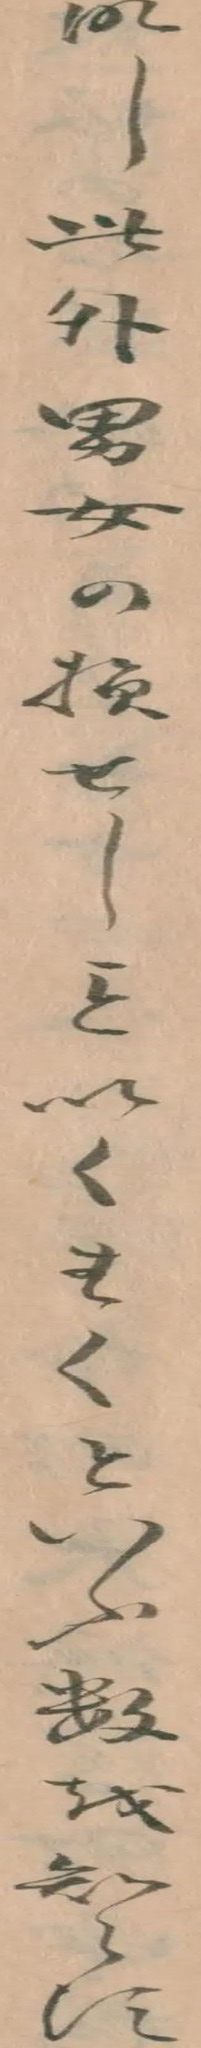なし此外男女の損せしこといくはくといふ数を知らす
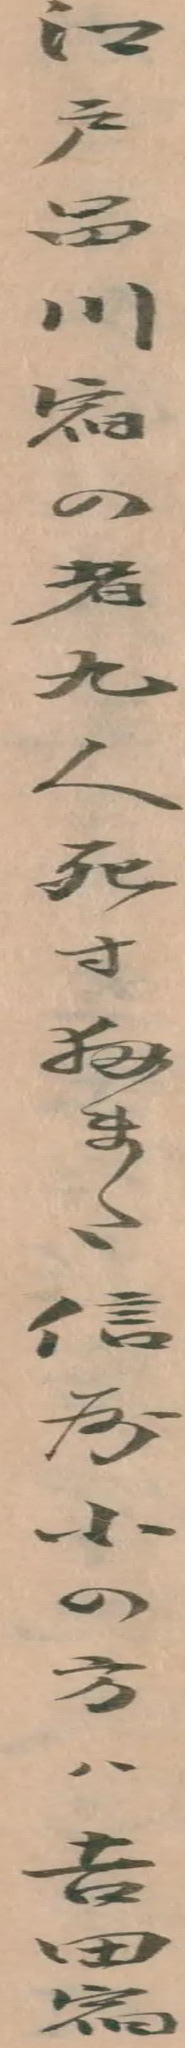江戸品川宿の者九人死す扨又信州北の方ハ吉田宿
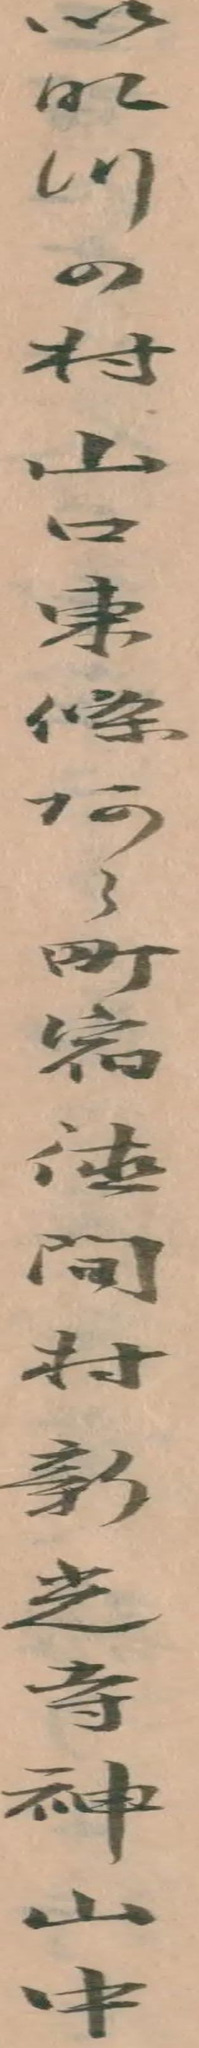いなつの村山口東条あら町宿徳間村新光寺神山中
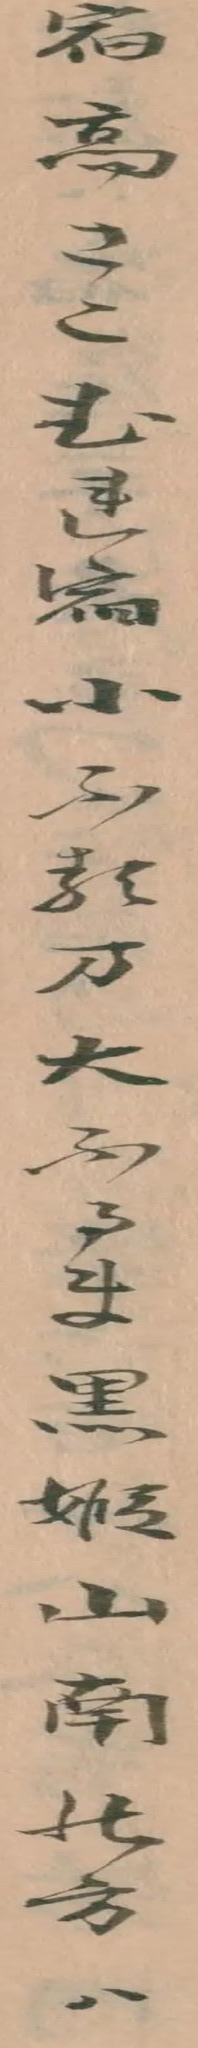宿高さこむれ宿小ふるま大ふるま黒姫山南の方ハ
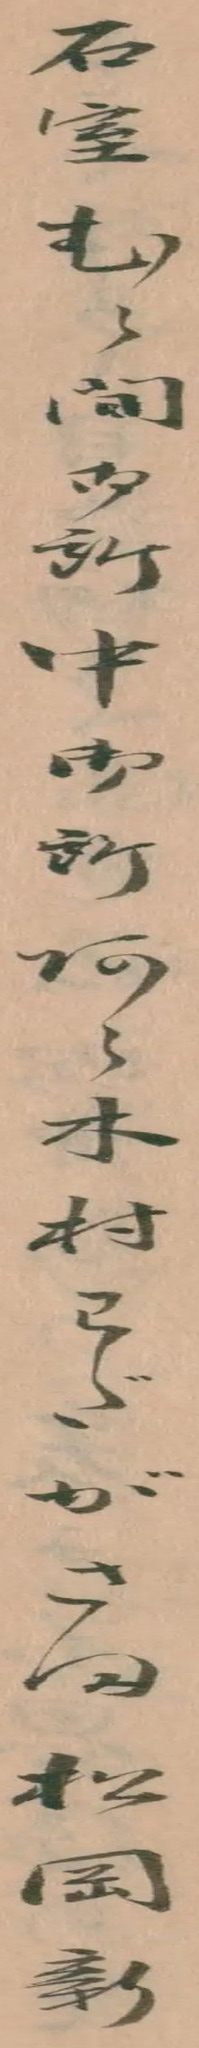石むろむら問御所中御所あら木村わだがさま松岡新
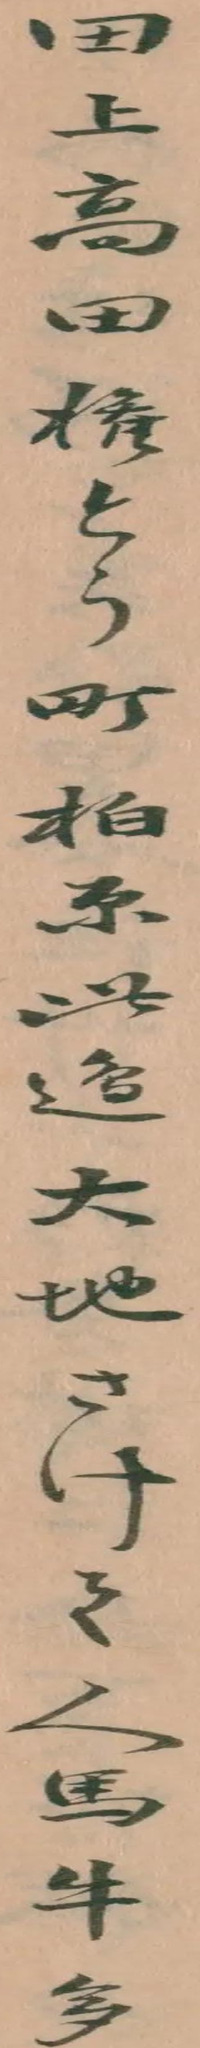田上高田権とう町柏原此辺大地さけて人馬牛多
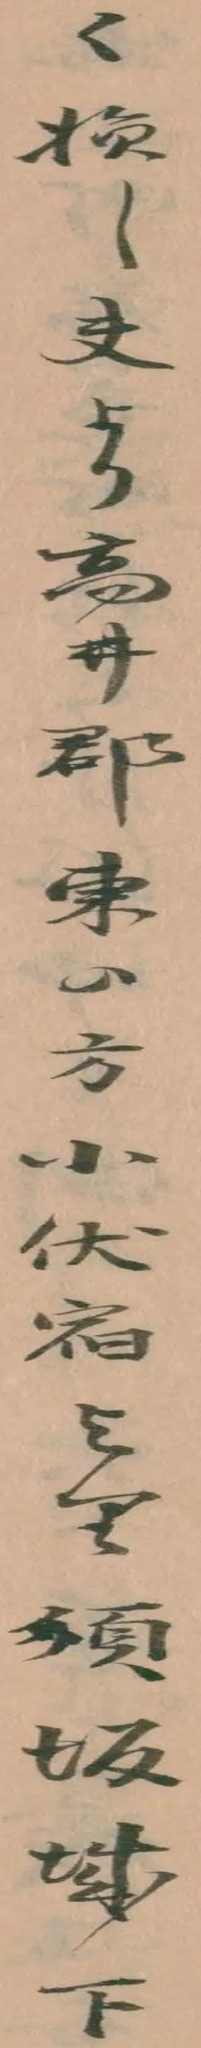く損し夫ゟ髙井郡東の方小伏宿より須坂城下
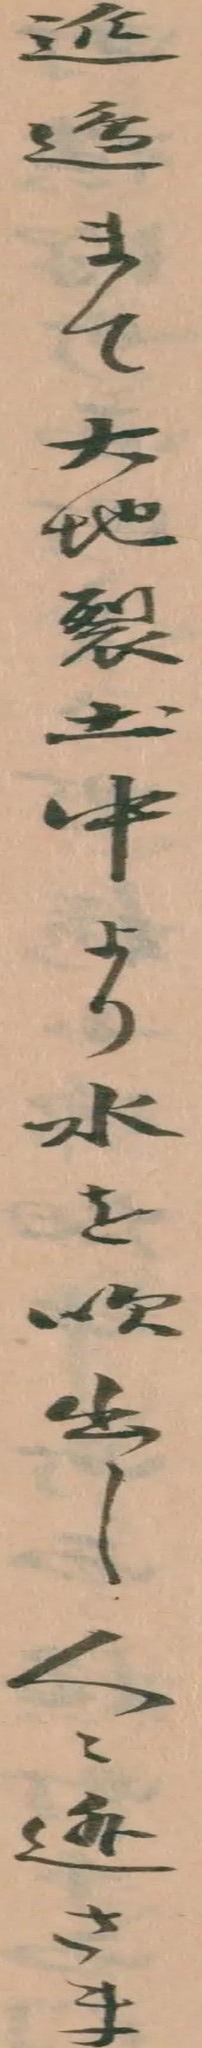近辺まで大地裂け土中より水を吹出し人々にけさま
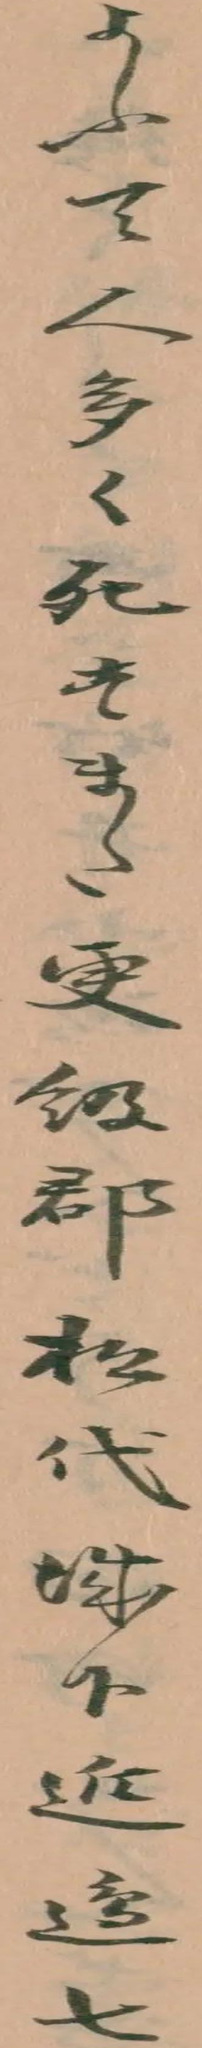よふて人多く死すまた更科郡松代城下近辺七
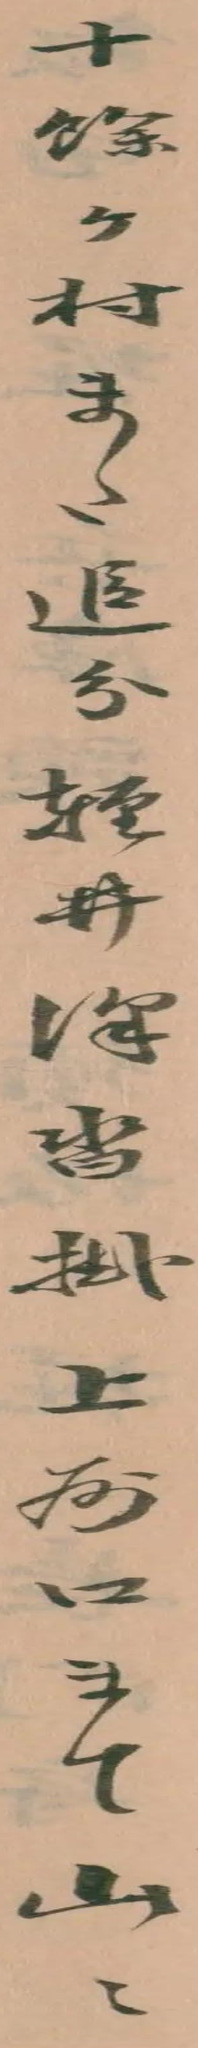十余ヶ村また追分軽井沢沓掛上州口まで山々
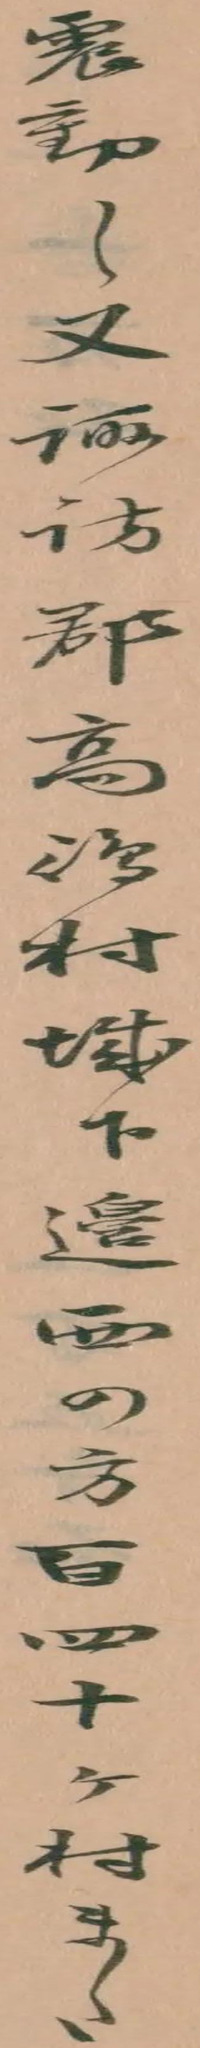震動し又諏訪郡高嶋村城下辺西の方百四十ヶ村また
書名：地災撮要. 巻3(地震之部)-巻4(噴火之部)
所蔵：国立国会図書館 National Diet Library, JAPAN
